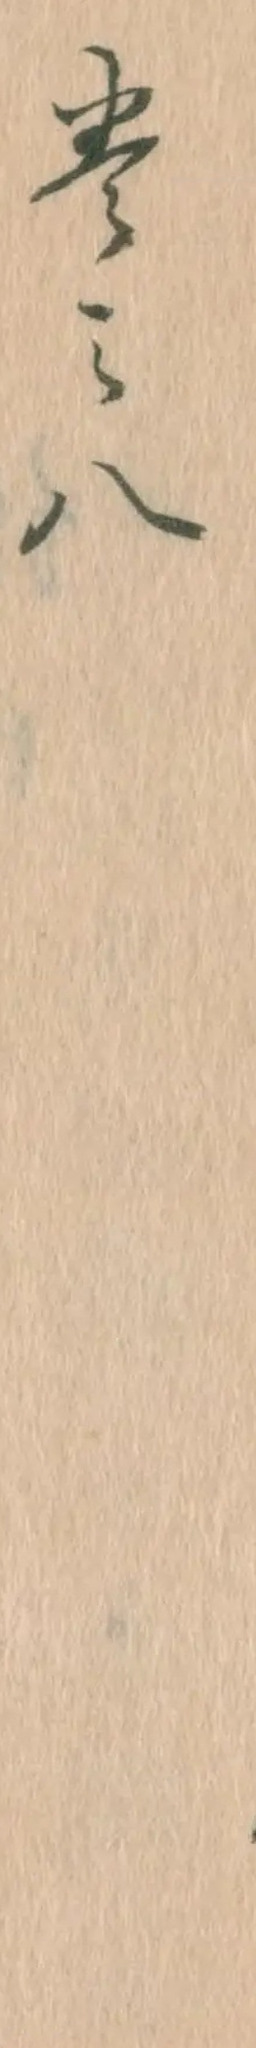巻之八
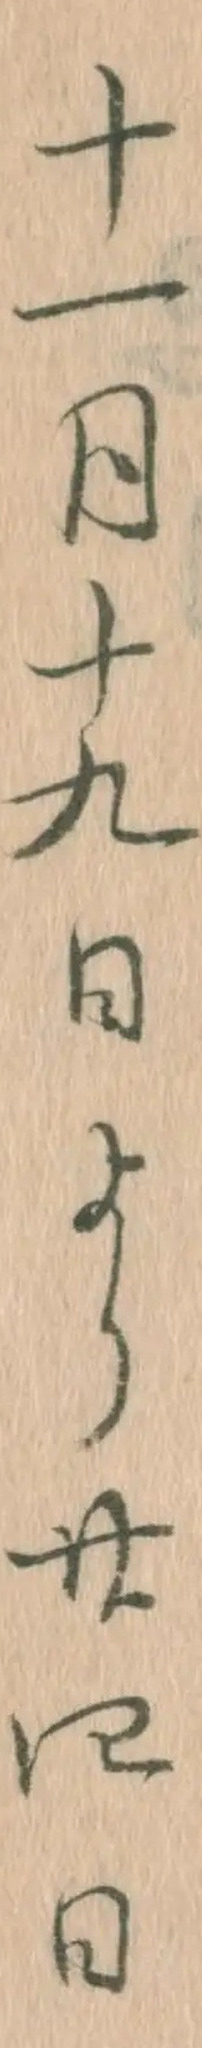十一月十九日より廿四日
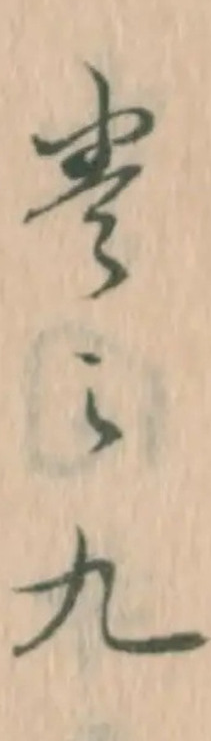巻之九
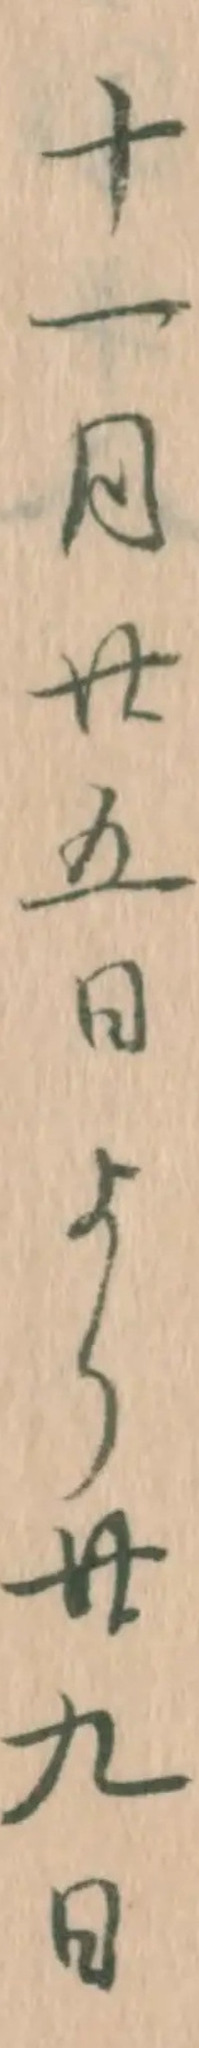十一月廿五日より廿九日
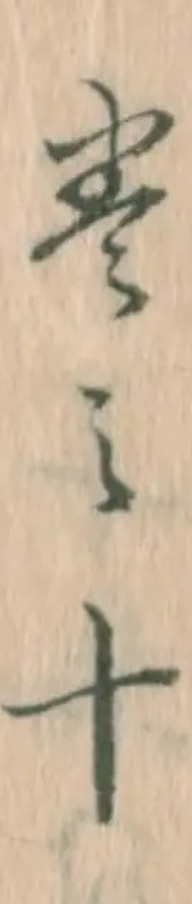巻之十
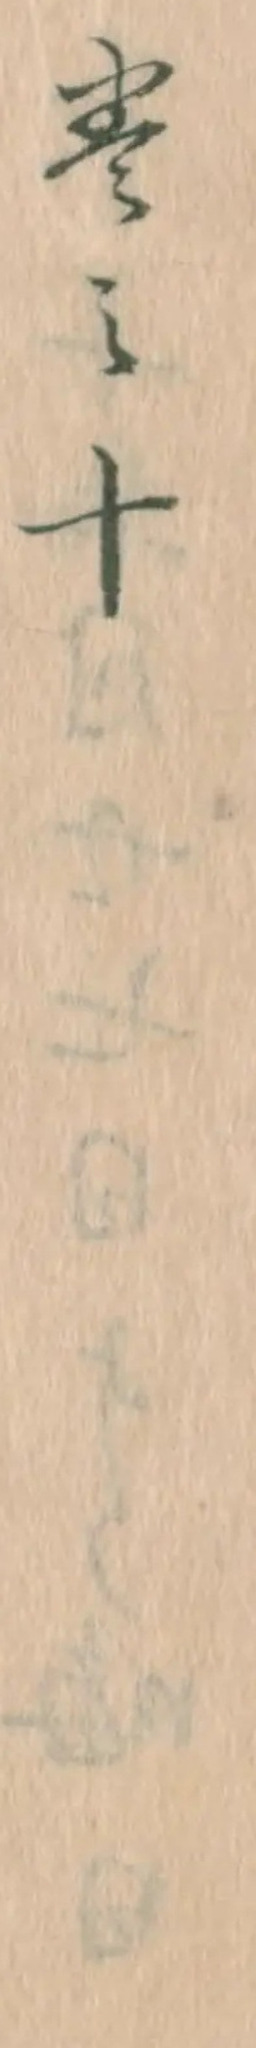巻之十
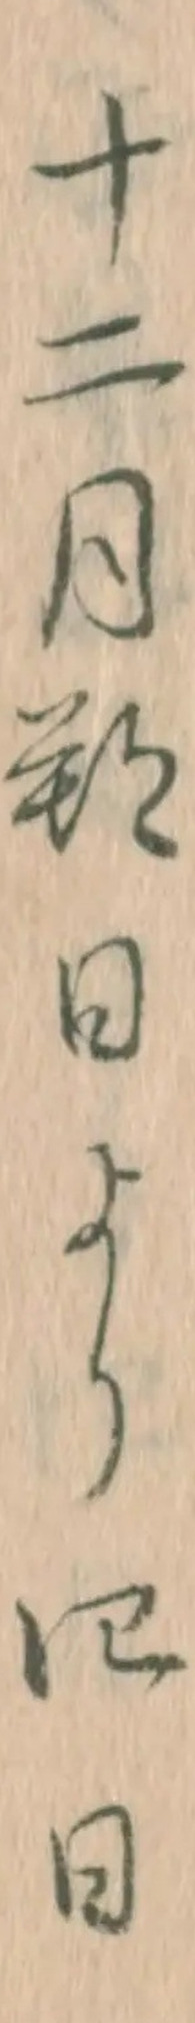十二月朔日より四日
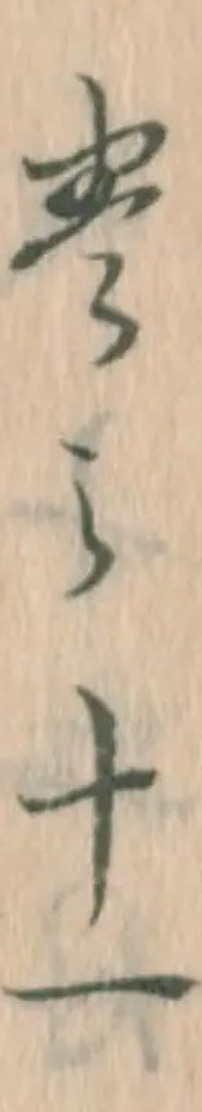巻之十一
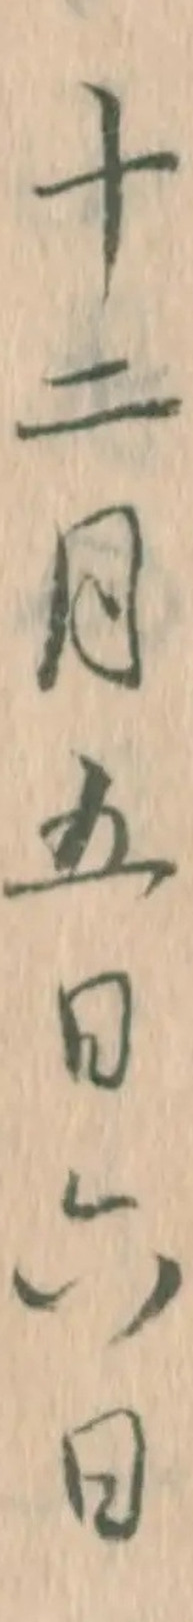十二月五日六日
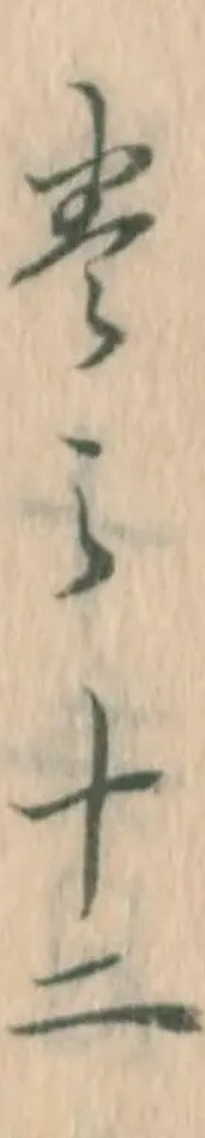巻之十二
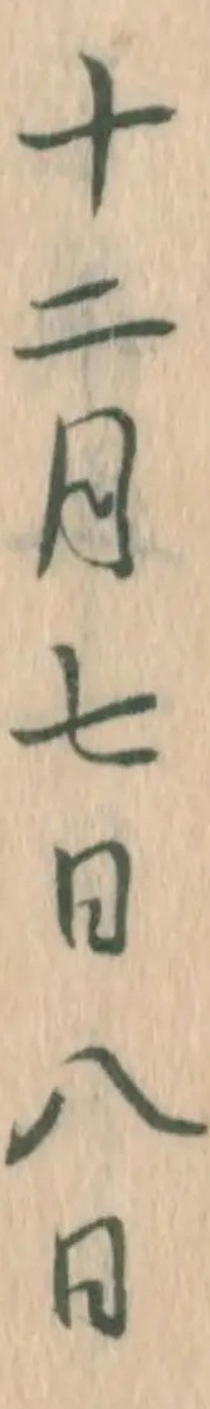十二月七日八日
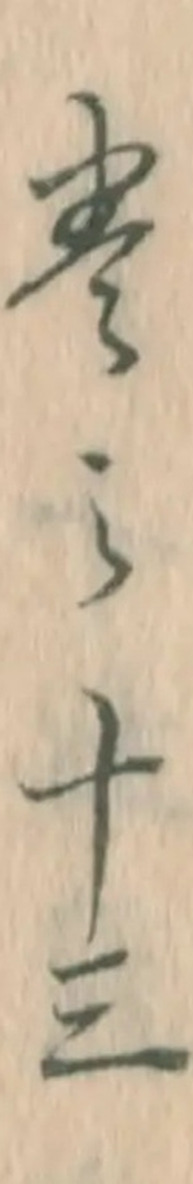巻之十三
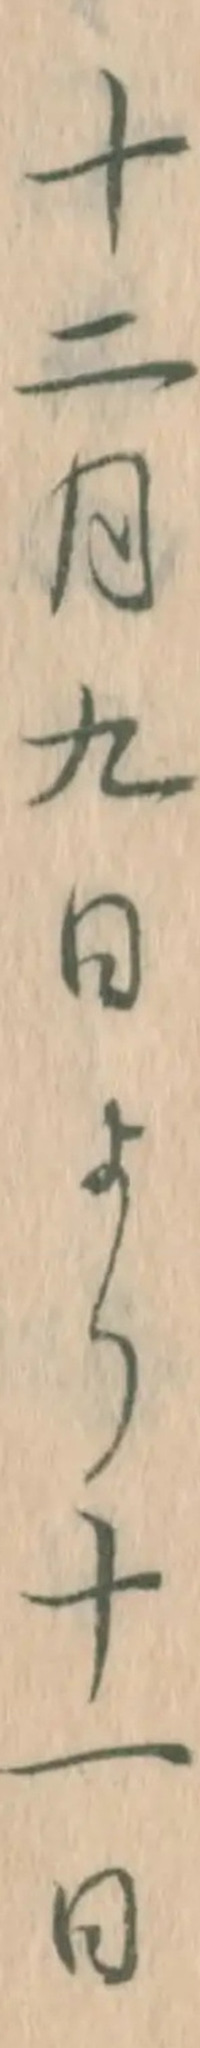十二月九日より十一日

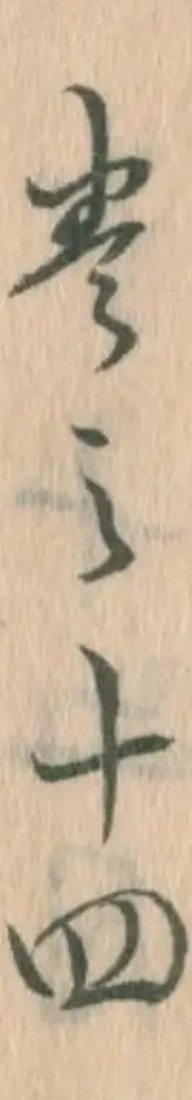巻之十四
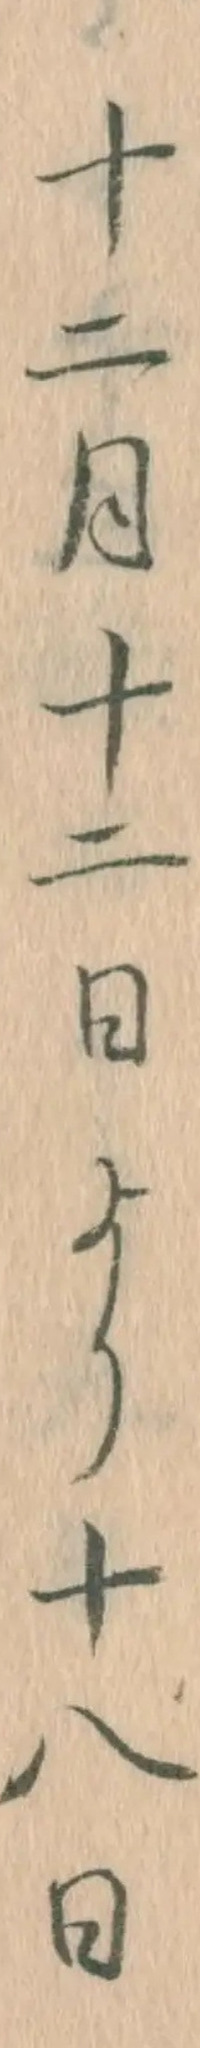十二月十二日より十八日
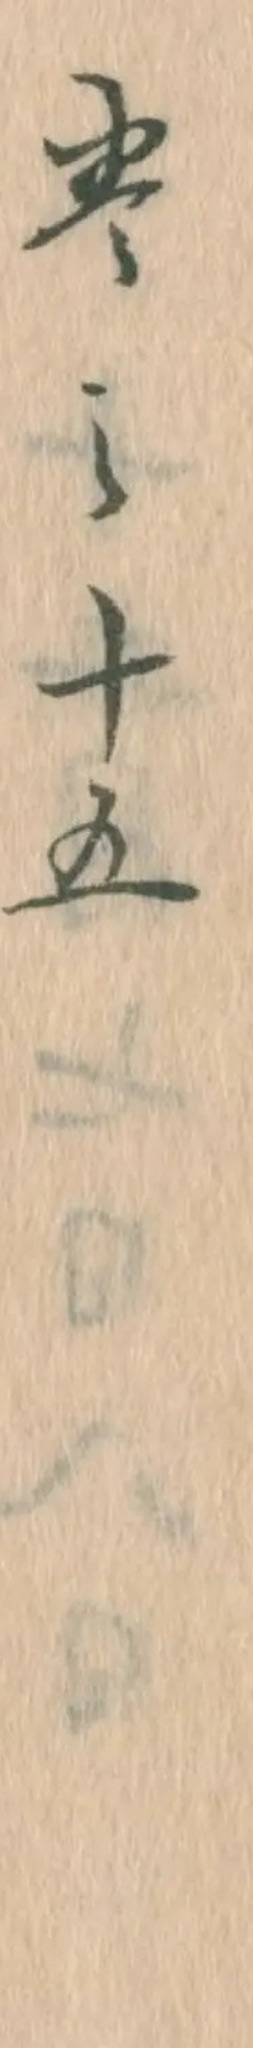巻之十五
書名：切支丹御退治記 49巻. [1]
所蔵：国立国会図書館 National Diet Library, JAPAN
